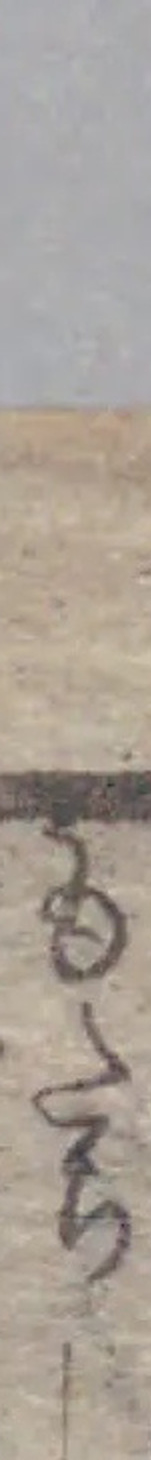もたち
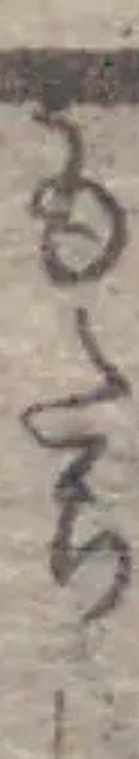もたち
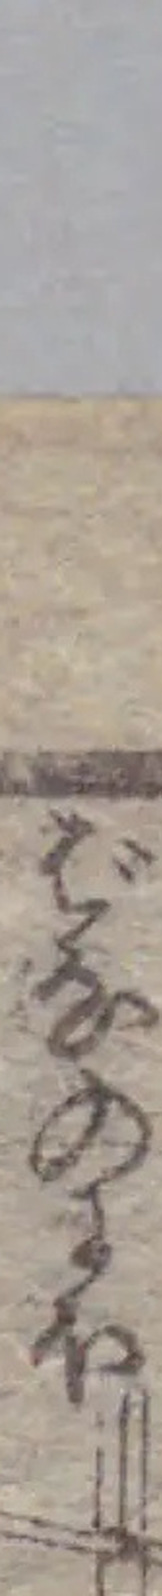ばなのにほ
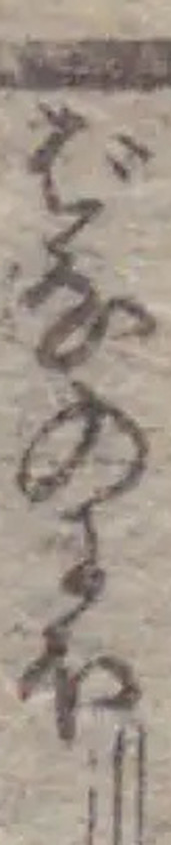ばなのにほ
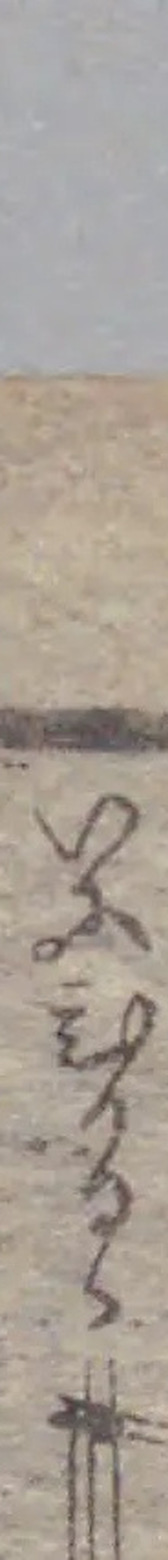いにひかるゝ
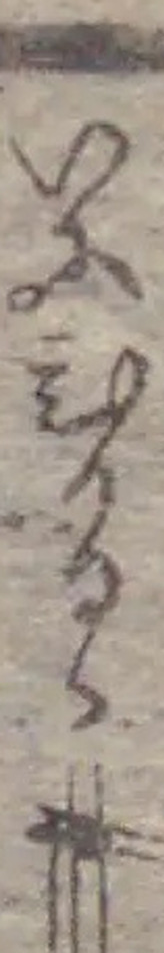いにひかるゝ
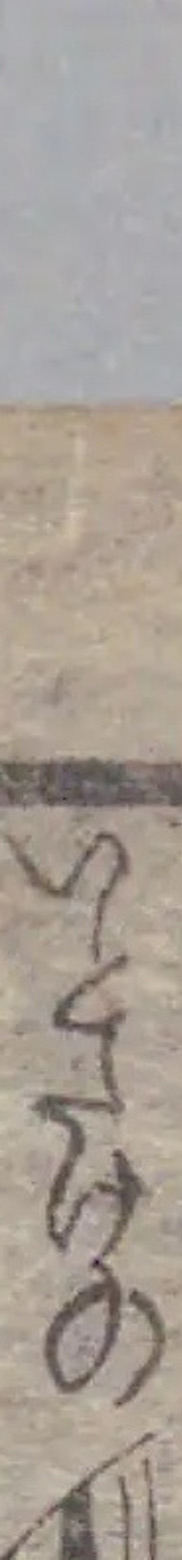いとたけの
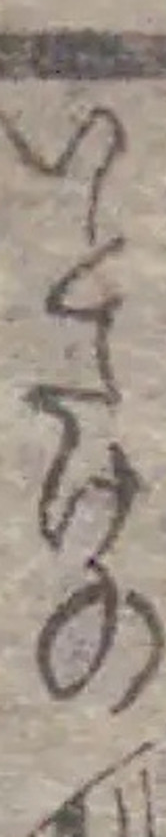いとたけの
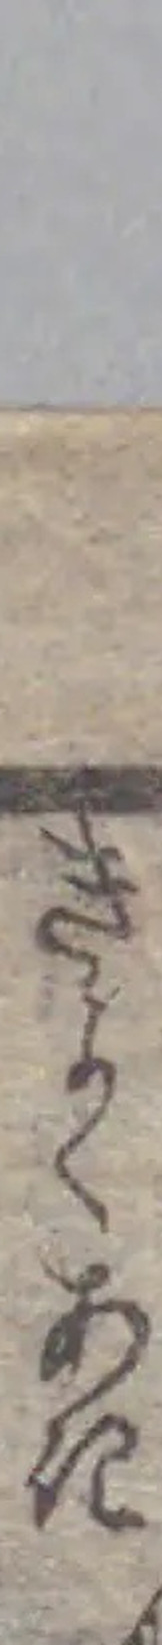きよくあき
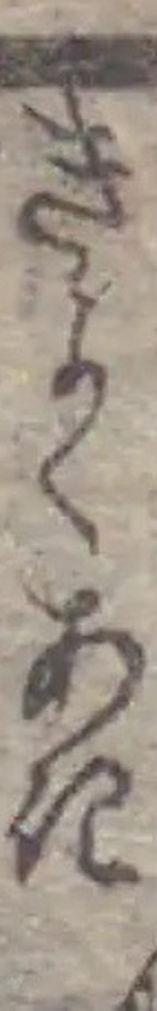きよくあき
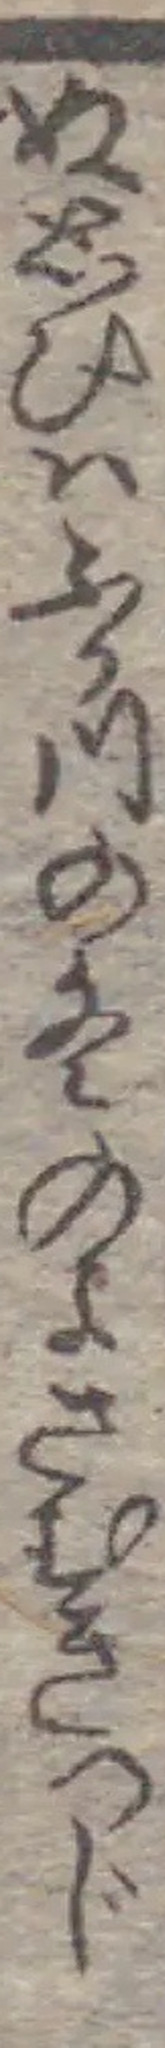ぬ思ひはふか川の冬のよさむきつじ
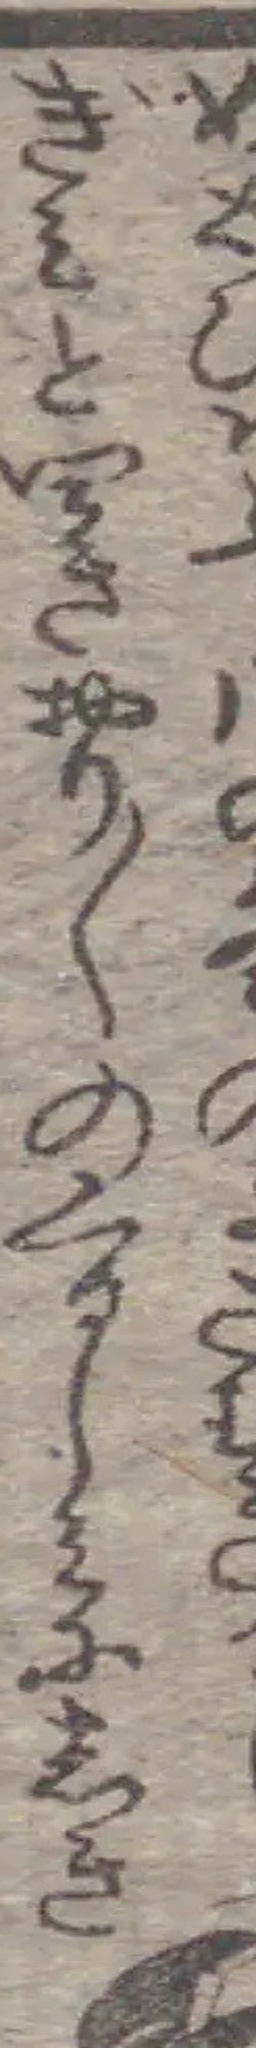ぎみと四きおり〳〵のくるしみにしき
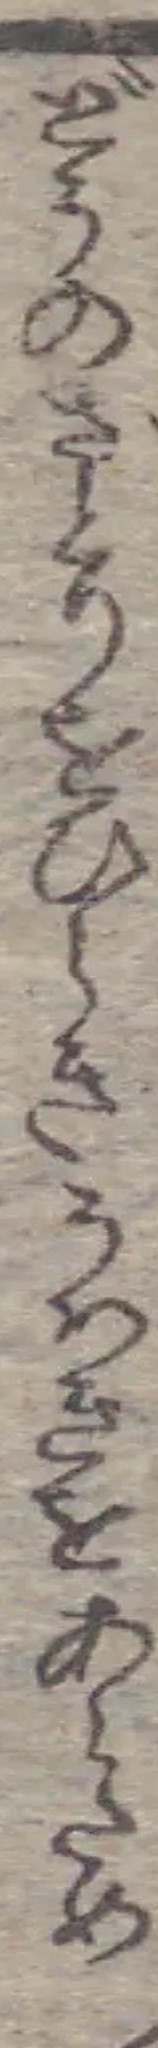どうのさとりをひらきうはきをあらため
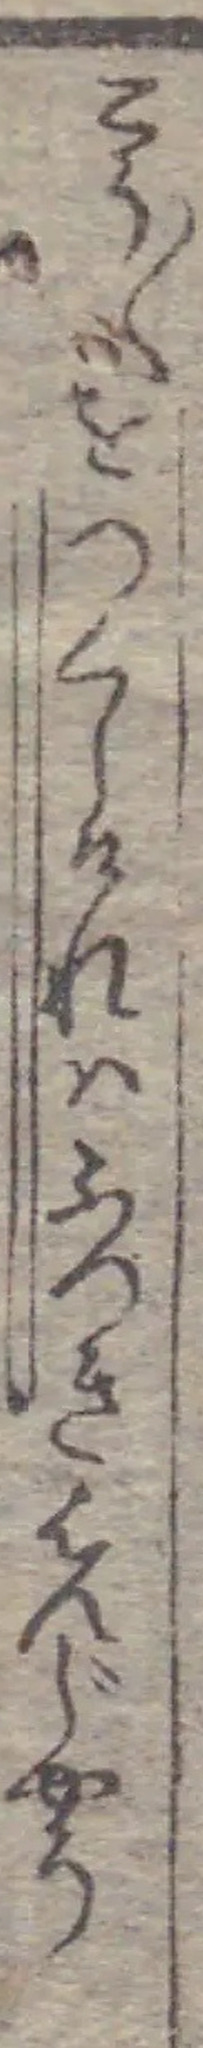こう〳〵をつくしけれはふつきはんじやう
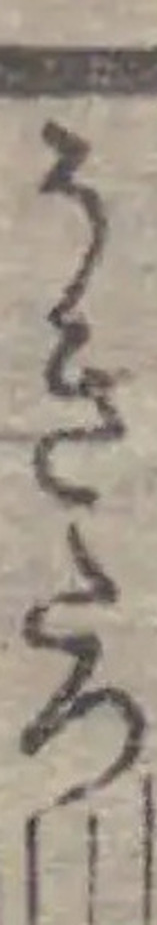うきたつ
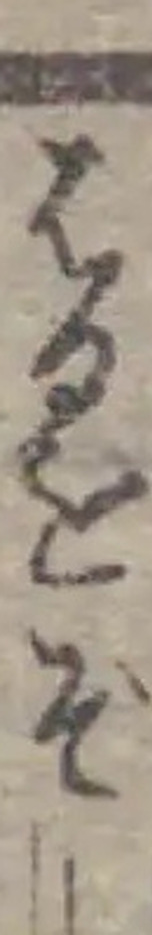はるをそ
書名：かんなんの夢枕 2巻
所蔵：国立国会図書館 National Diet Library, JAPAN
